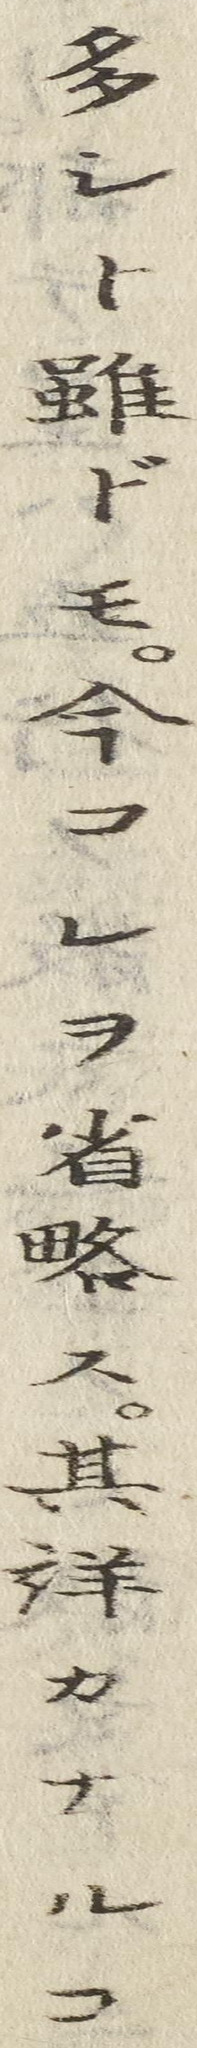多シト雖ドモ。今コレヲ省略ス。其詳カナルコ
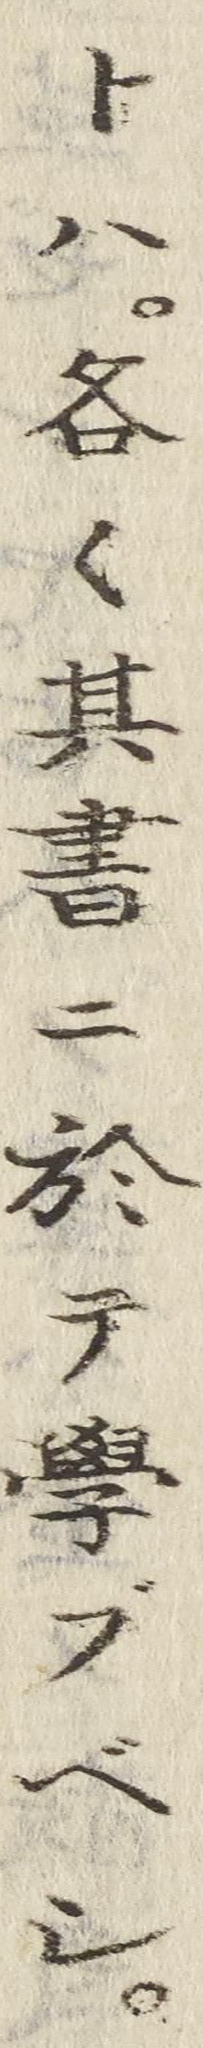トハ。各〳〵其書ニ於テ学ベシ。
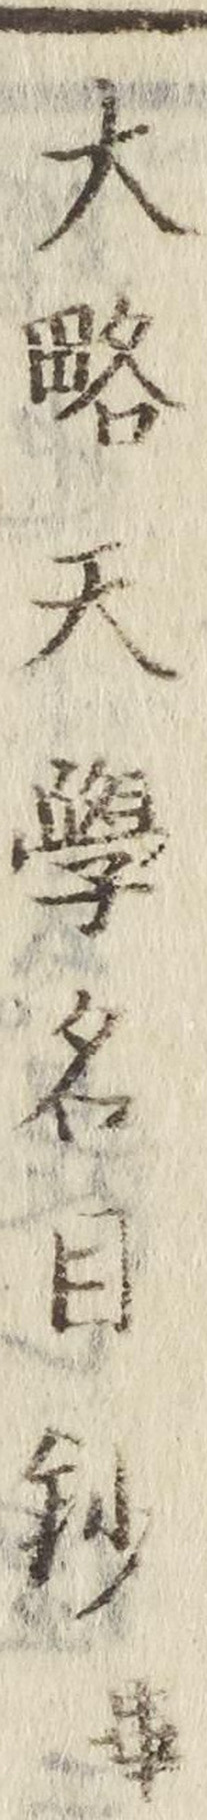大略天学名目鈔畢

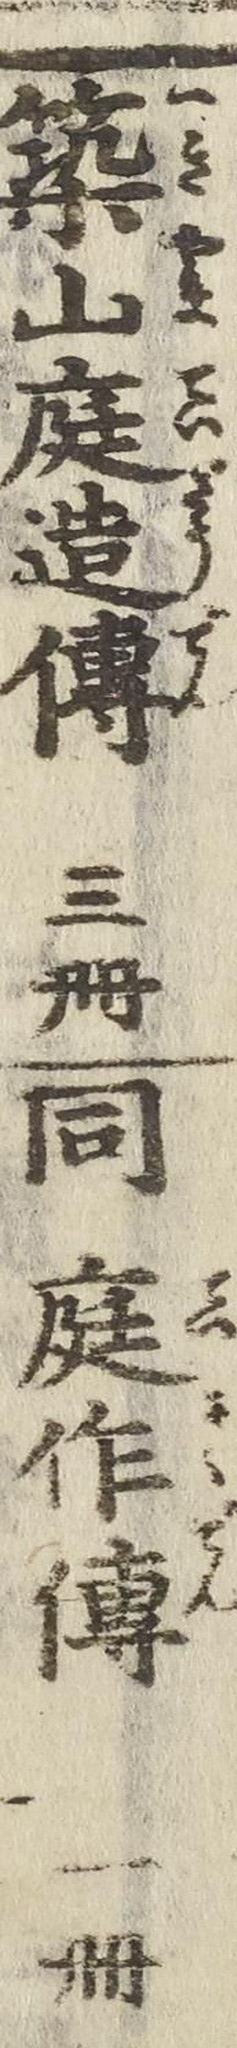築山庭造伝三冊同庭作伝一冊

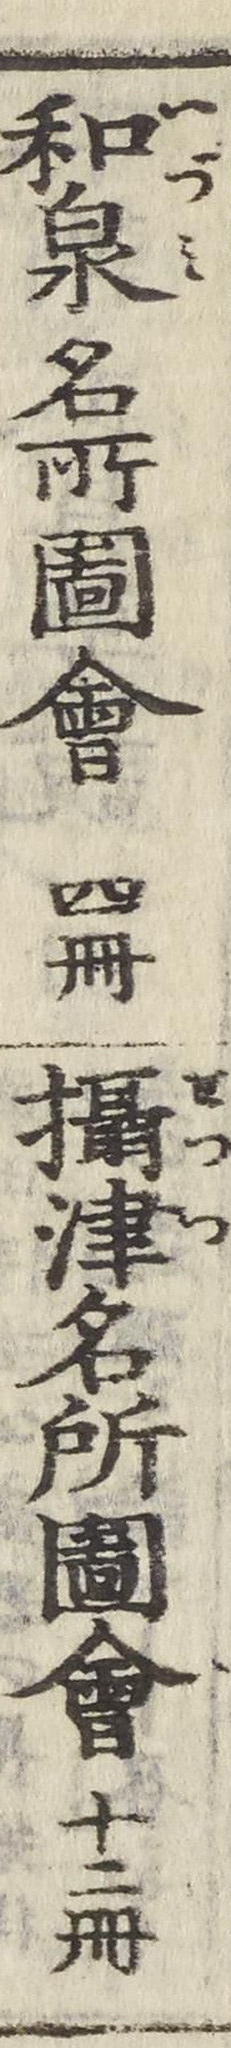和泉名所図絵四冊摂津名所図会十二冊
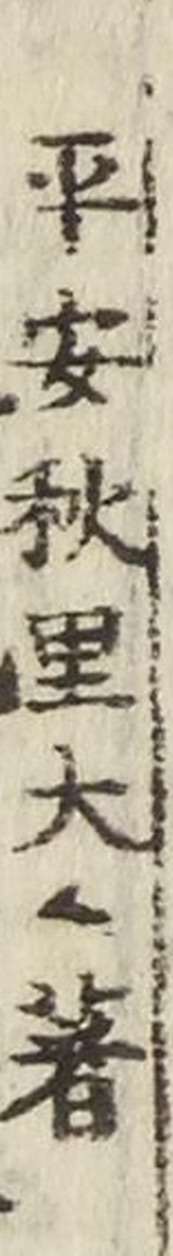平安秋里大人著
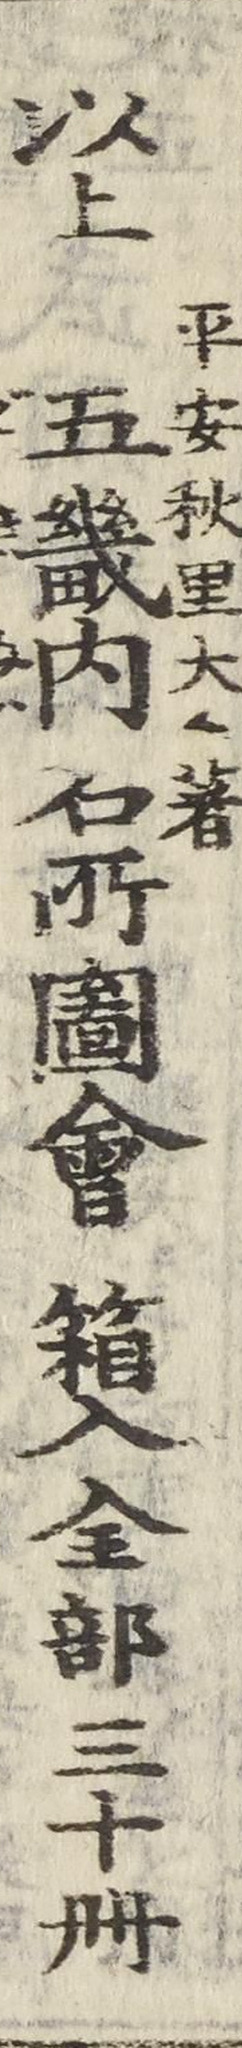以上五畿内名所図会箱入全部三十冊
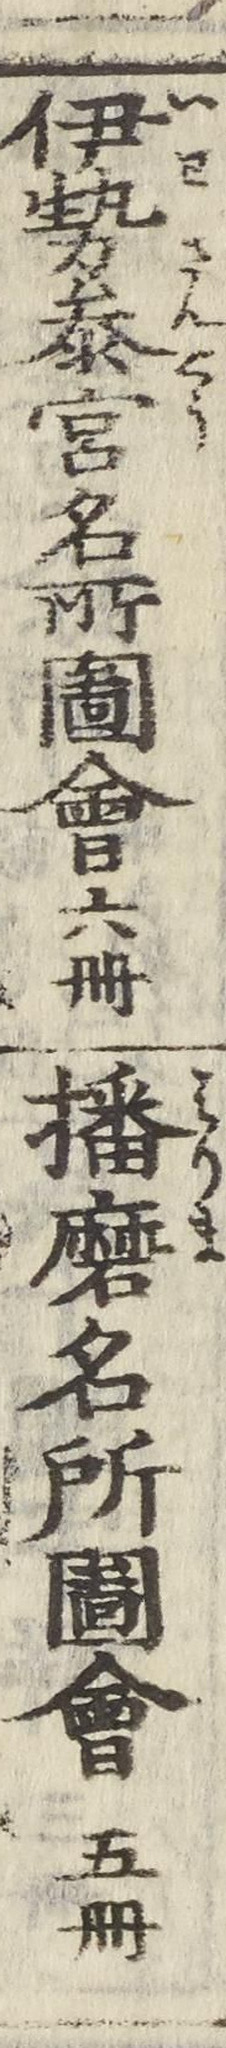伊勢参宮名所図会六冊播磨名所図会五冊
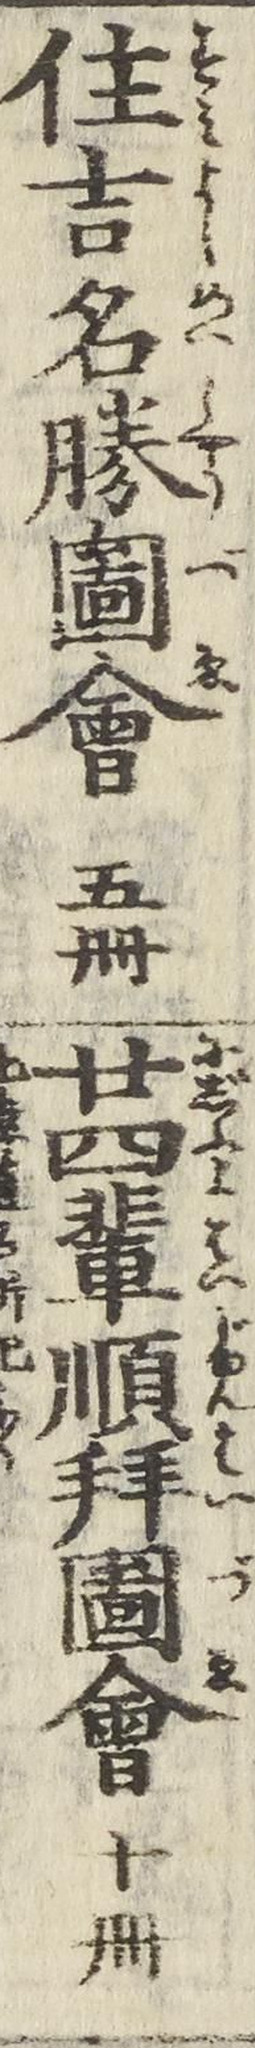住吉名勝図会五冊廿四輩順拝図会十冊
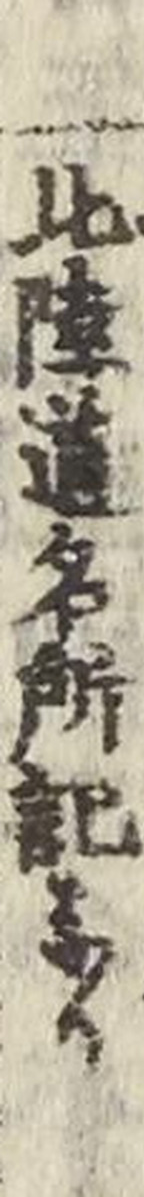北陸道名所記なり
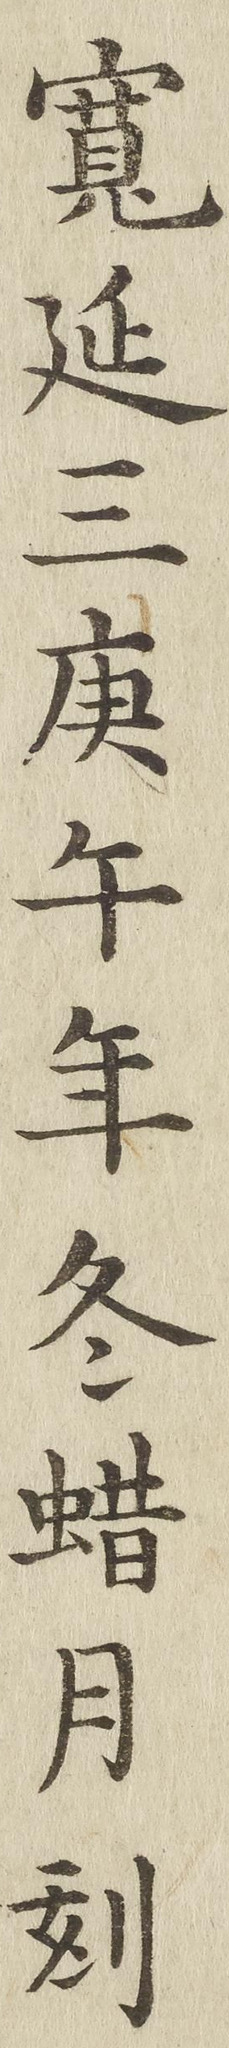寛延三庚午年冬蜡月刻
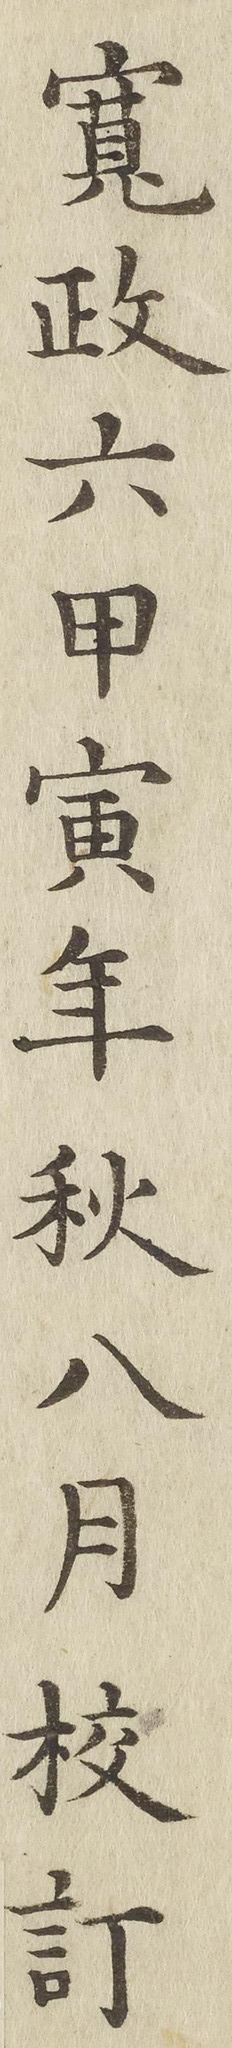寛政六甲寅年秋八月校訂
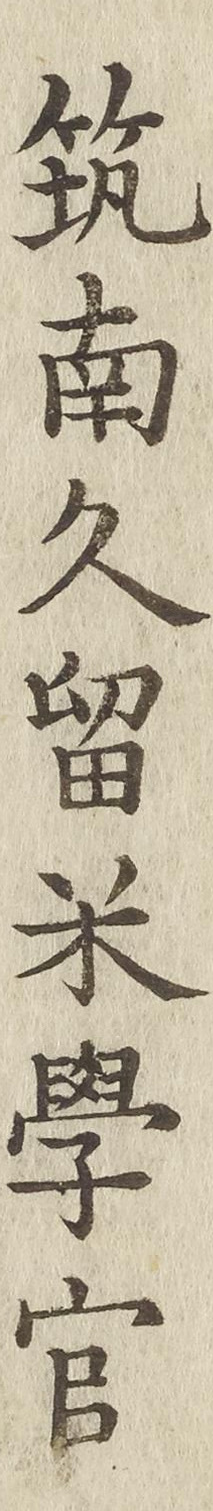筑南久留米学官
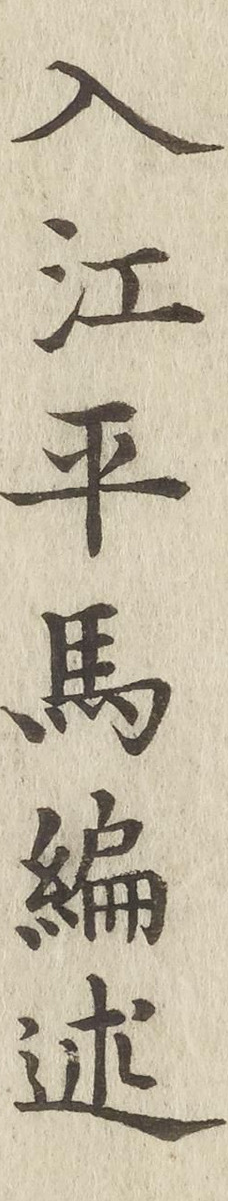入江平馬編述
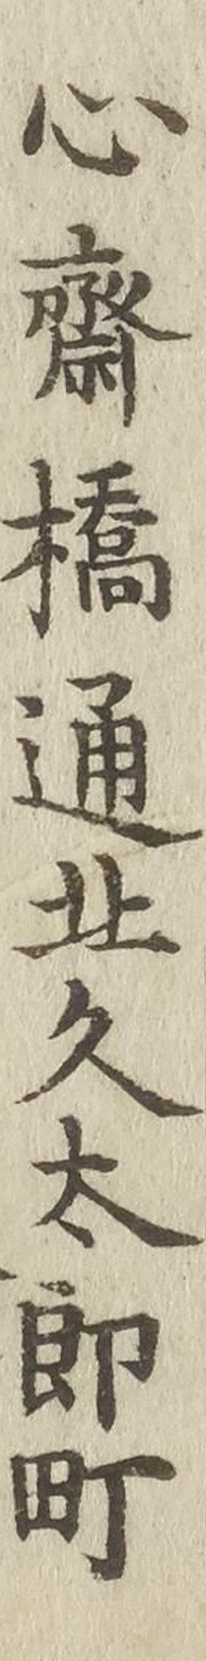心斎橋通北久太郎町
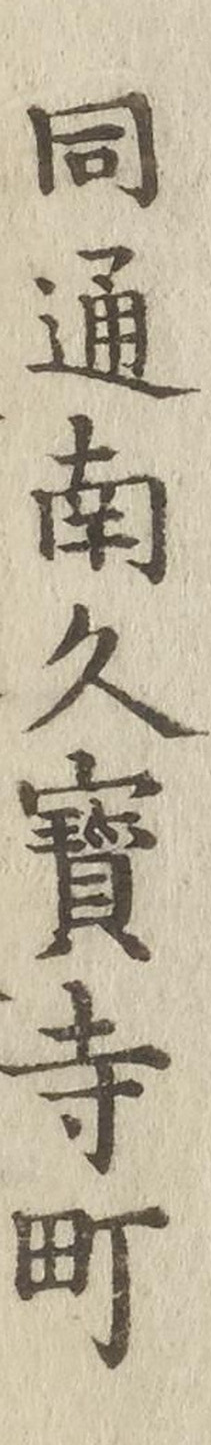同通南久宝寺町
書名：大略天学名目鈔　天經或問附録
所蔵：東京大学地震研究所図書室 Earthquake Research Institute Library, The University of Tokyo, JAPAN
